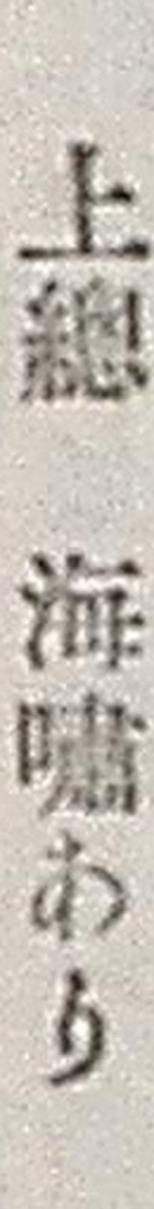上総海嘯あり
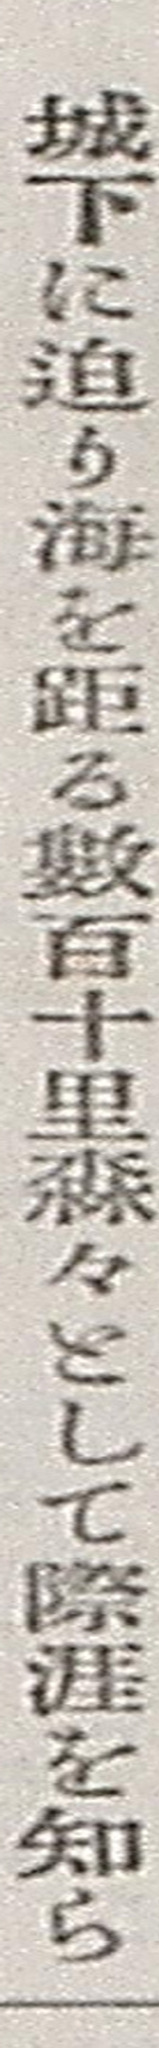城下に迫り海を距る数百十里森々として際涯を知ら
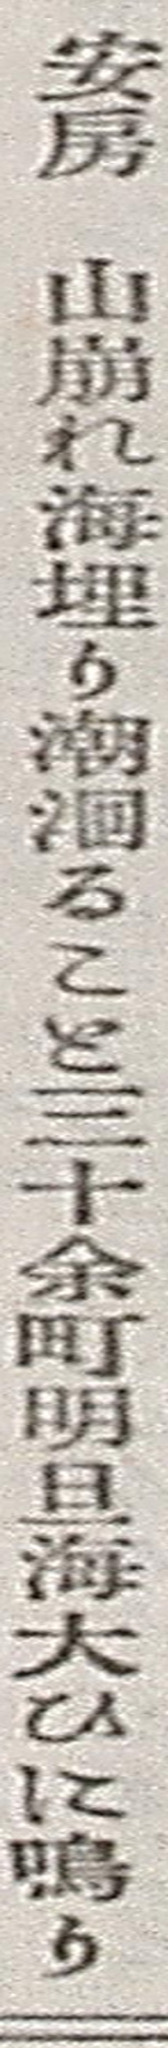安房山崩れ埋り潮洄ること三十余町明旦海大ひに鳴り
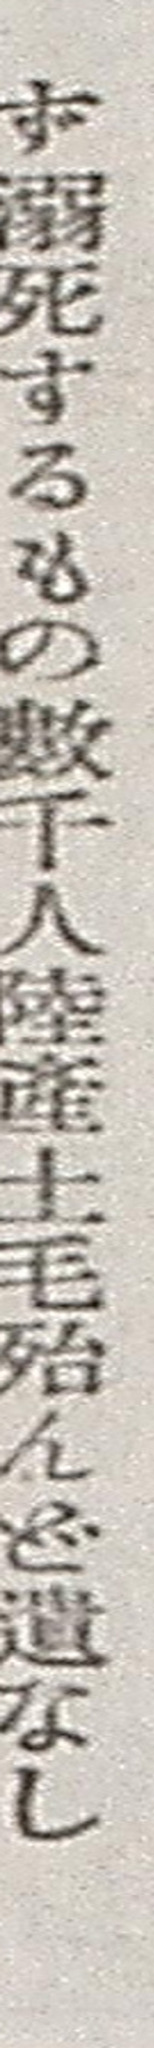ず溺死するもの数千人陸産土毛殆んど遺なし
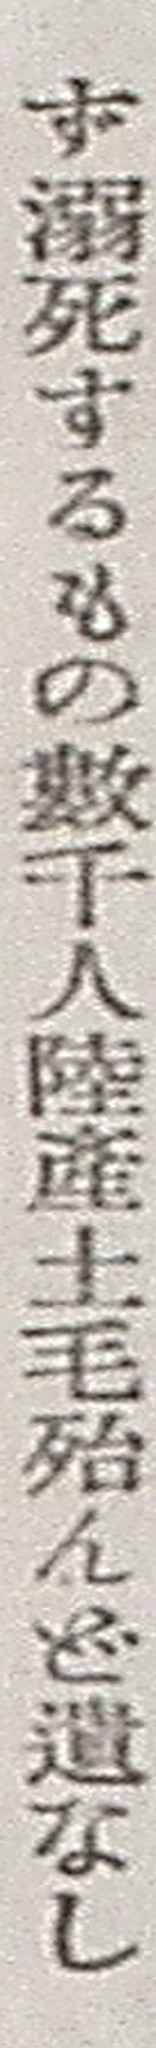ず溺死するもの数千人陸産土毛殆んど遺なし
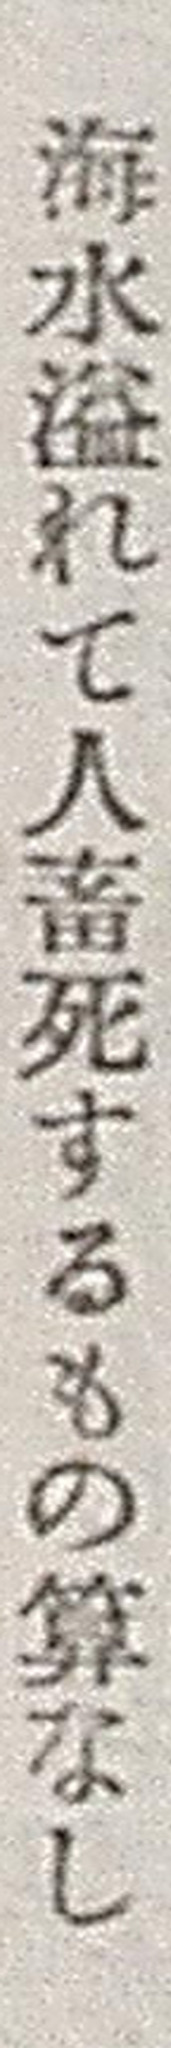海水溢れて人畜死するもの算なし
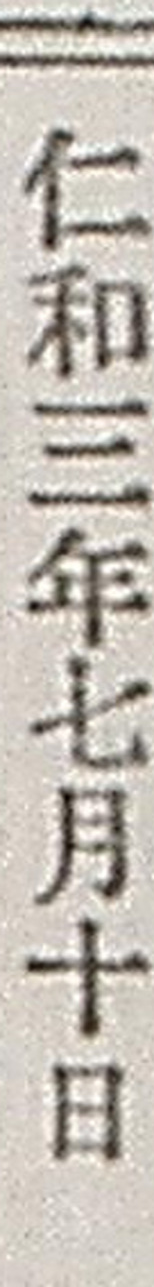仁和三年七月十日
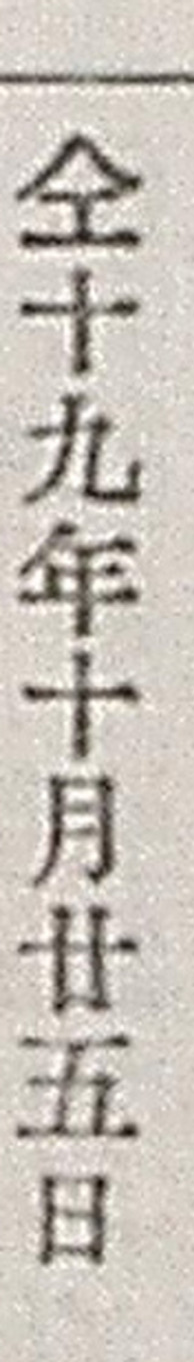仝十九年十月廿五日
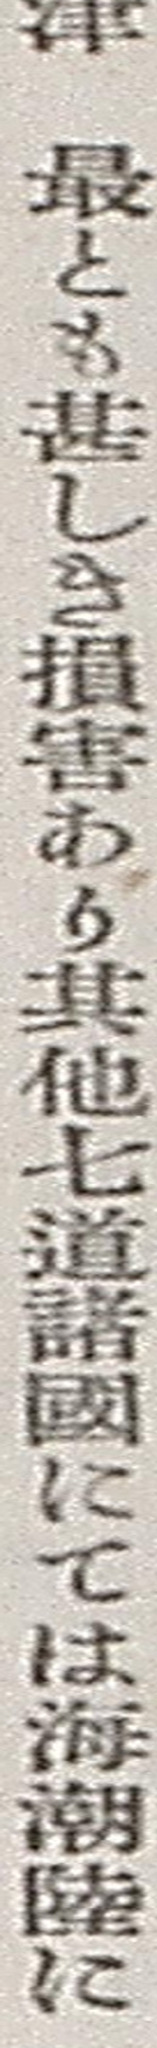摂津最とも甚しき損害あり其他七道諸国にては海潮陸に
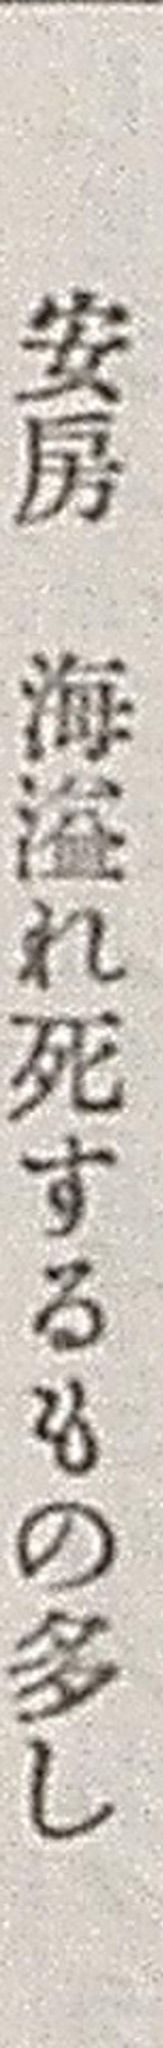安房海溢れ死するもの多し
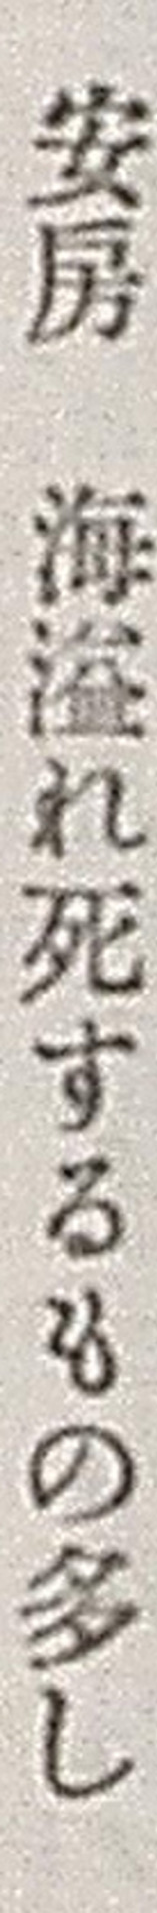安房海溢れ死するもの多し
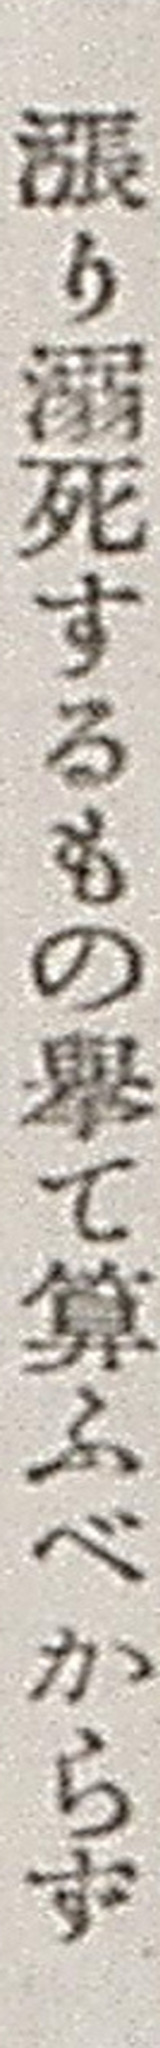漲り溺死するもの挙て算ふべからず
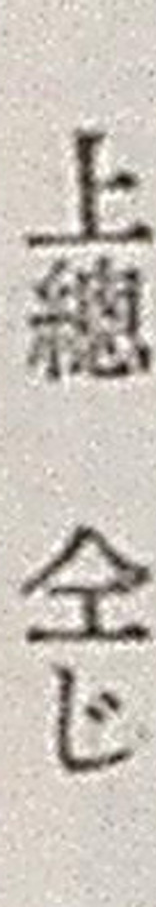上総仝じ
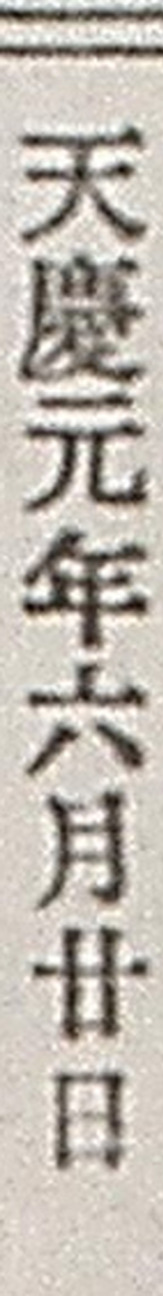天慶元年六月廿日
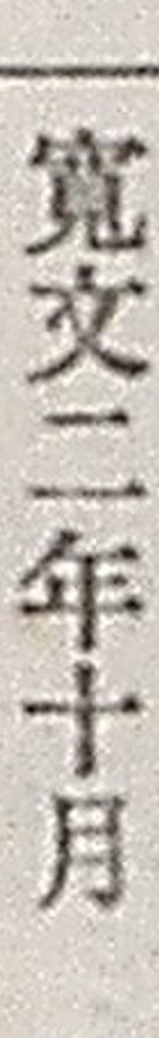寛文二年十月
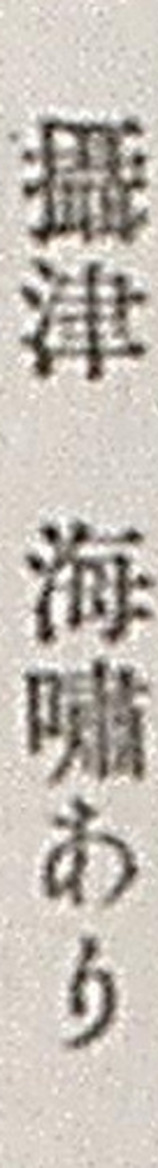摂津海嘯あり
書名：風俗畫報臨時増刊第百二十號　大海嘯被害録（下）
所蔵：東京大学地震研究所図書室 Earthquake Research Institute Library, The University of Tokyo, JAPAN
